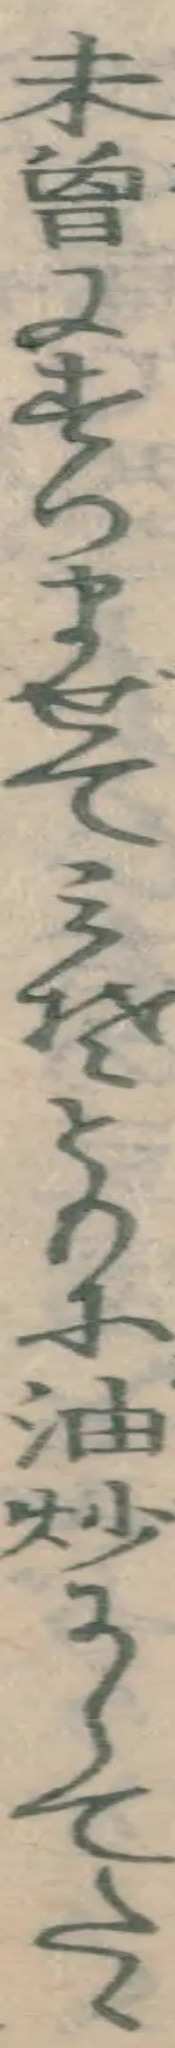未曽にすりまぜてみそともに油炒にしてたゝ
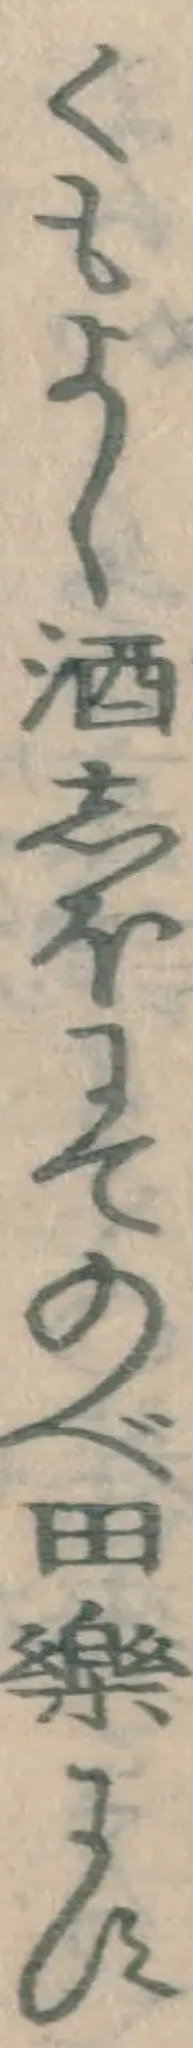くもよし酒しほにてのべ田楽にす
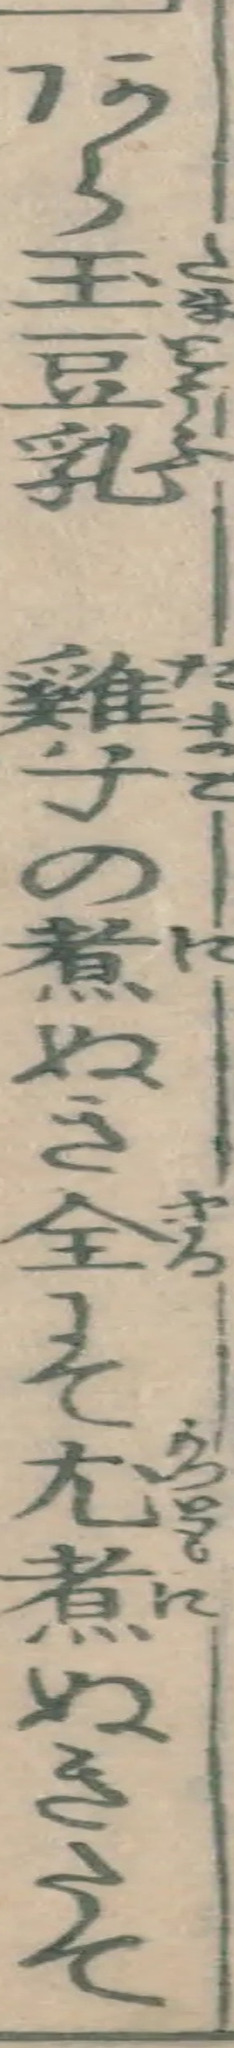五十一あら玉豆乳鶏子の煮ぬき全にて尤煮ぬきたて
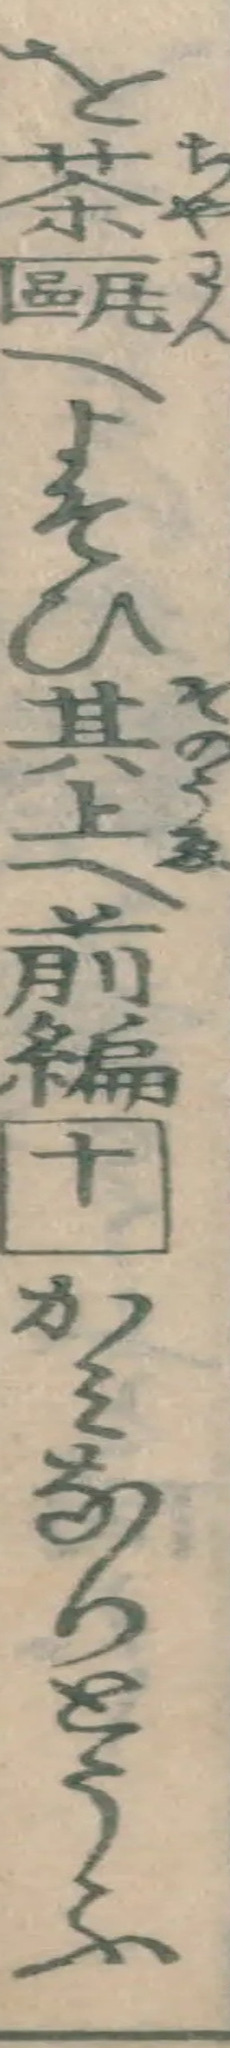を茶甌へよそひ其上へ前編十かみなりとうふ

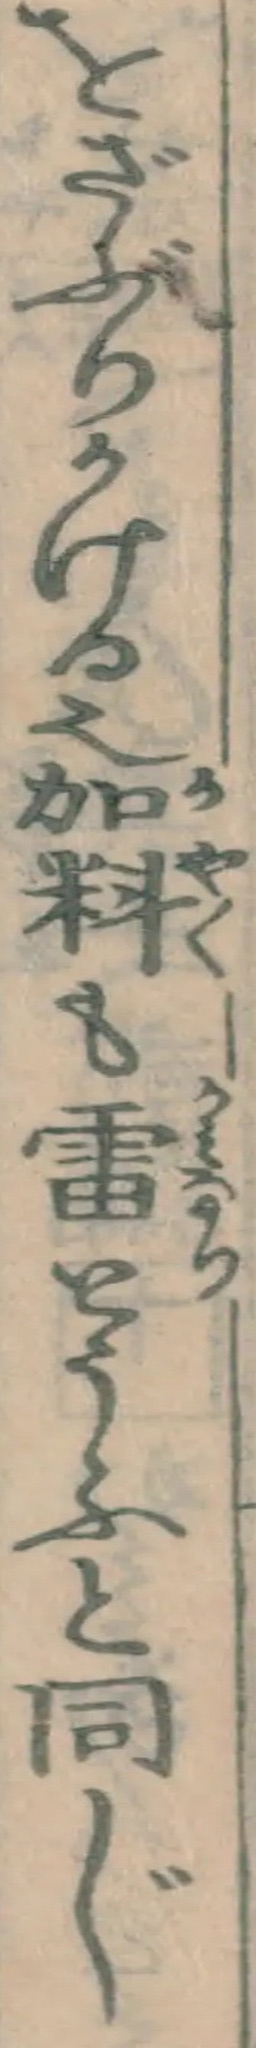をざぶりかける也加料も雷とうふと同じ
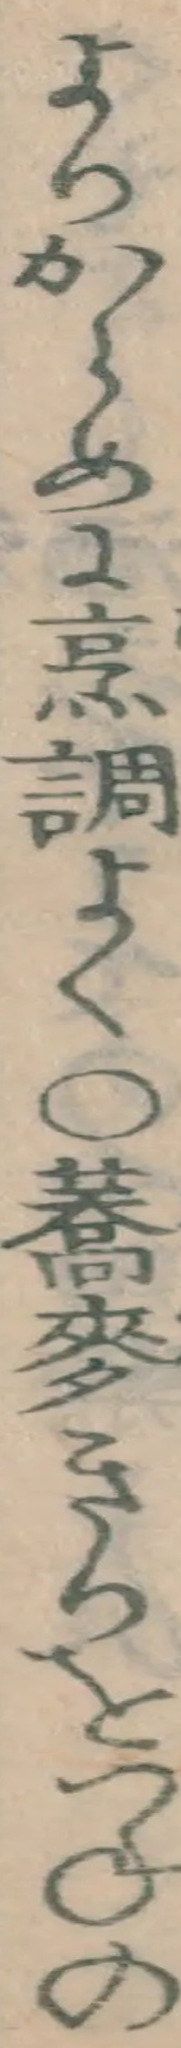よりからめに烹調よく○蕎麦きりをつねの
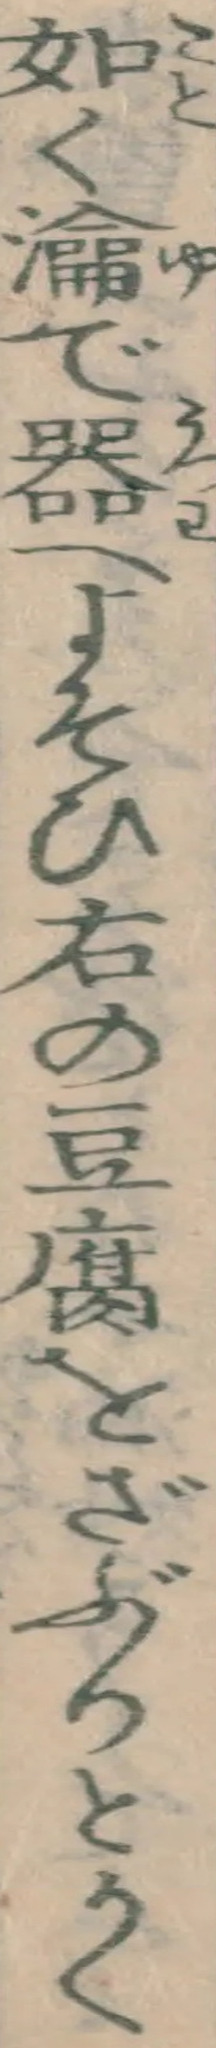如く瀹で器へよそひ右の豆腐をざぶりとかく
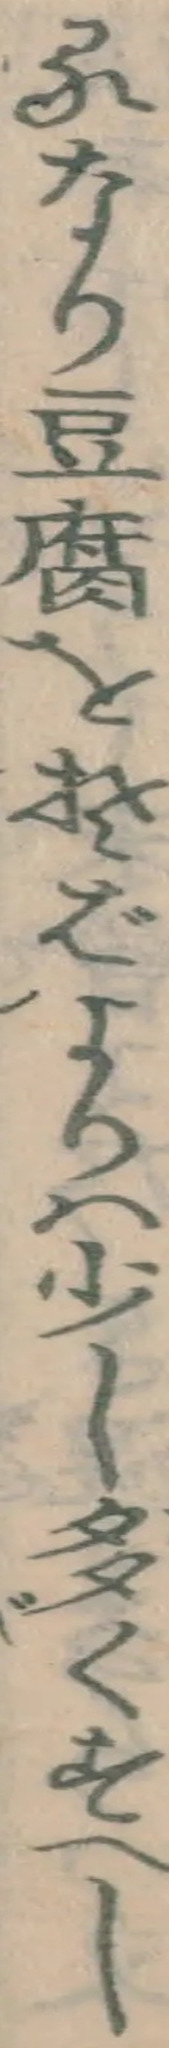るなり豆腐をそばよりは少し多くすべし
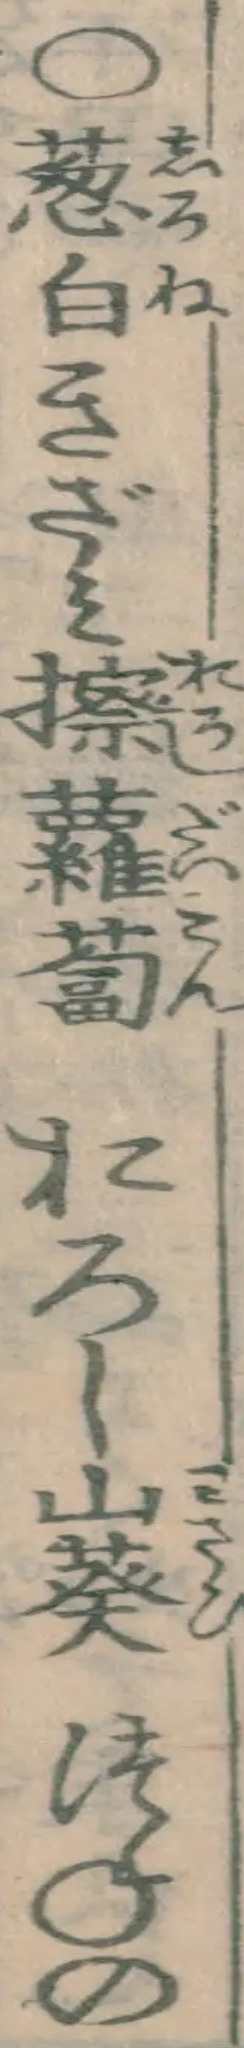○葱白きざみ擦蘿蔔おろし山葵つねの
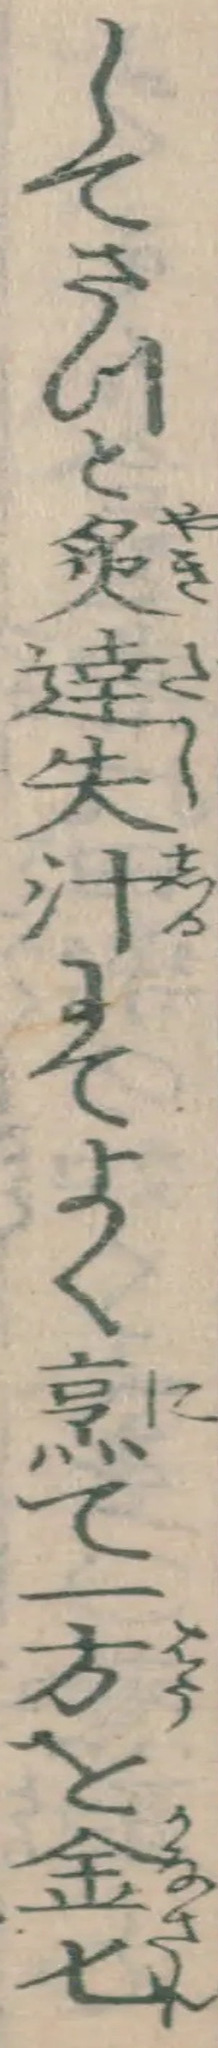してさつと炙達失汁にてよく烹て一方を金匕
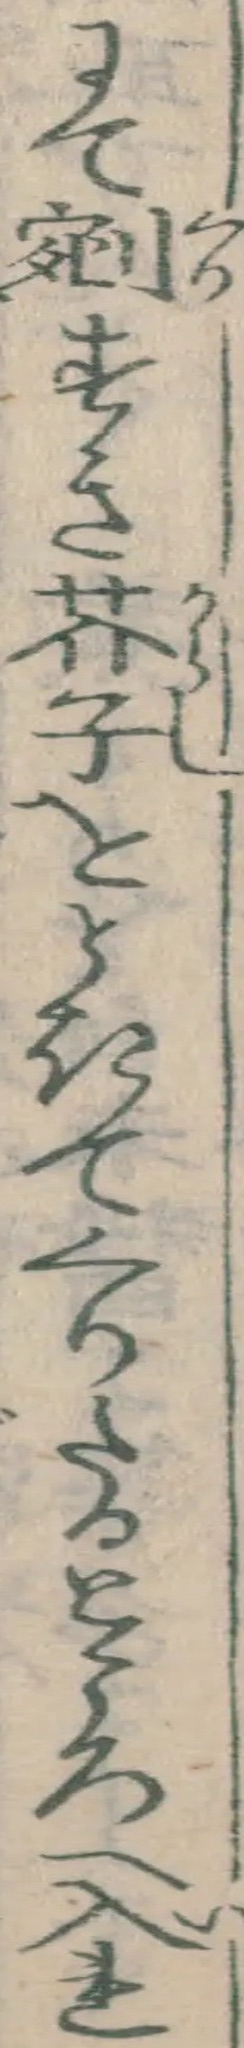にて剜すき芥子をときてくりたるところへ入れ
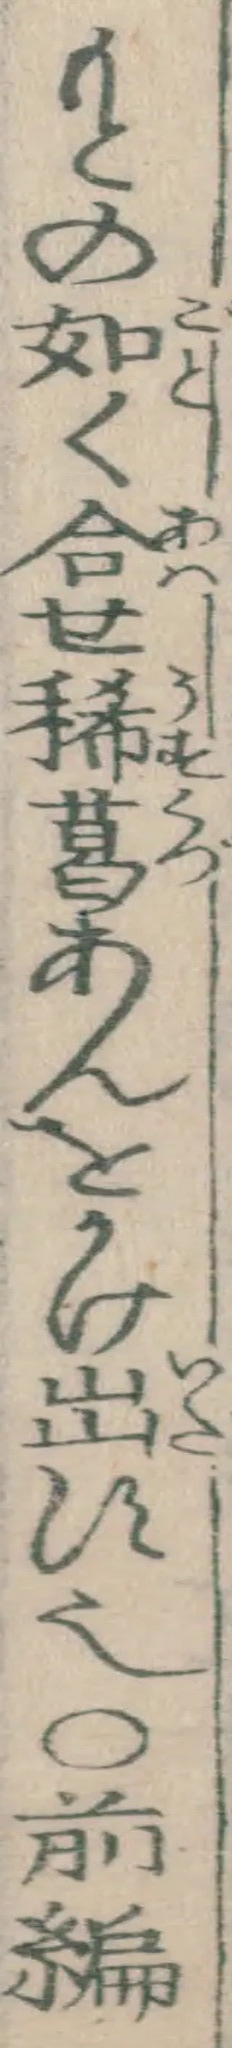もとの如く合せ稀葛あんをかけ出す也○前編
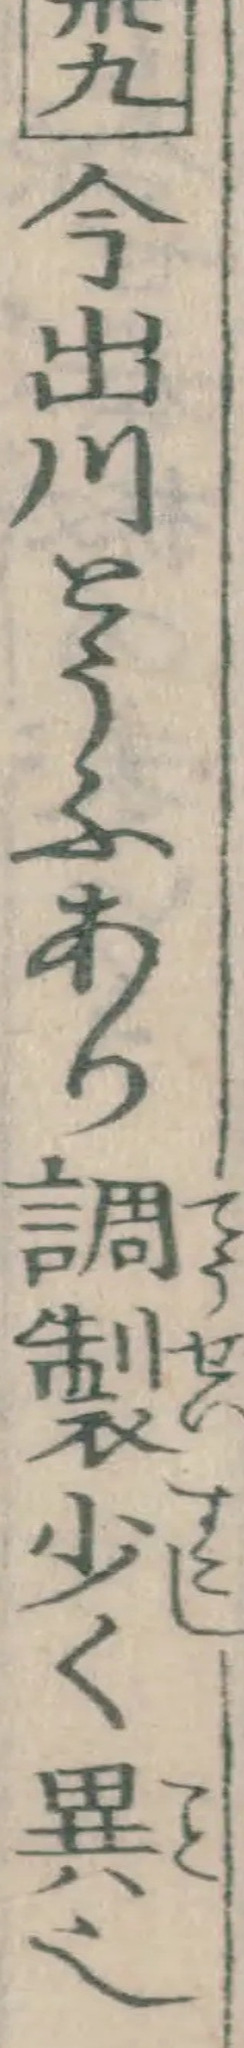卅九今出川とうふあり調製少く異也
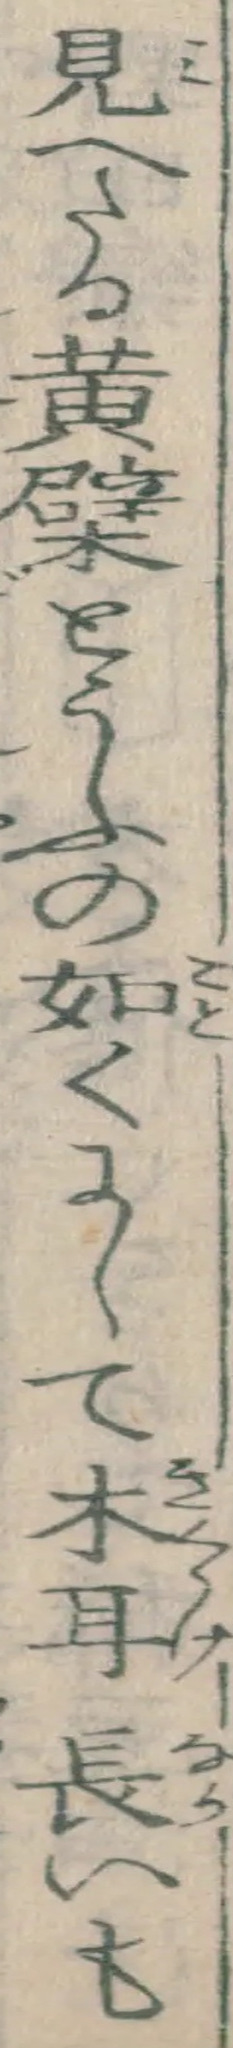見へたる黄檗とうふの如くにして木耳長いも
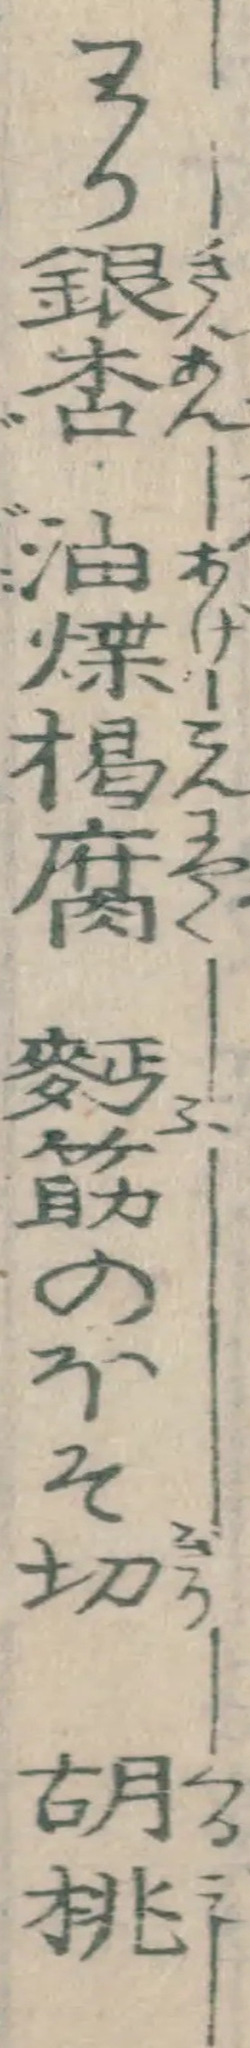わり銀杏油煠褐腐麺筋のほそ切胡桃
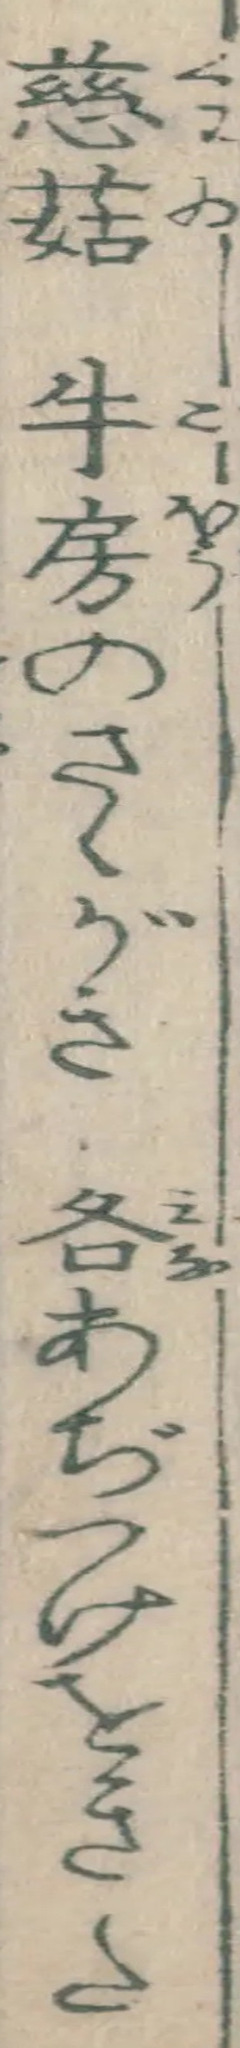慈姑午房のさゝがき各あぢつけをきた
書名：豆腐百珍. 続編
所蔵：国立国会図書館 National Diet Library, JAPAN
